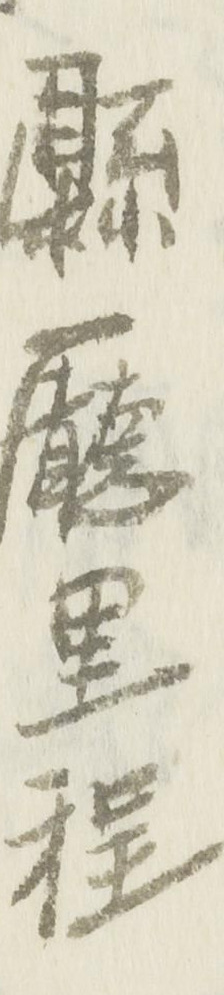県庁里程
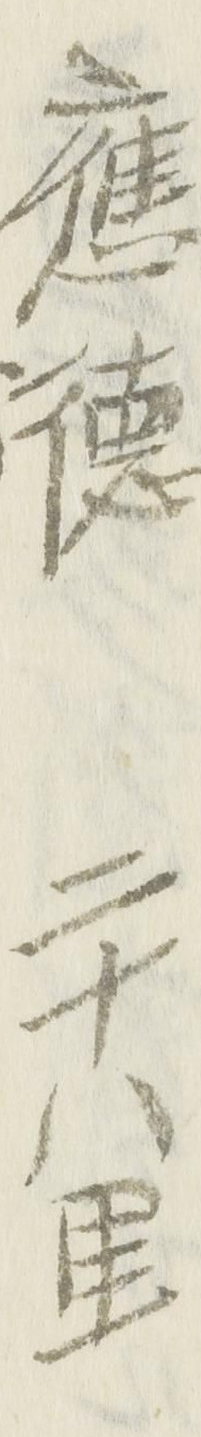応徳二十八里
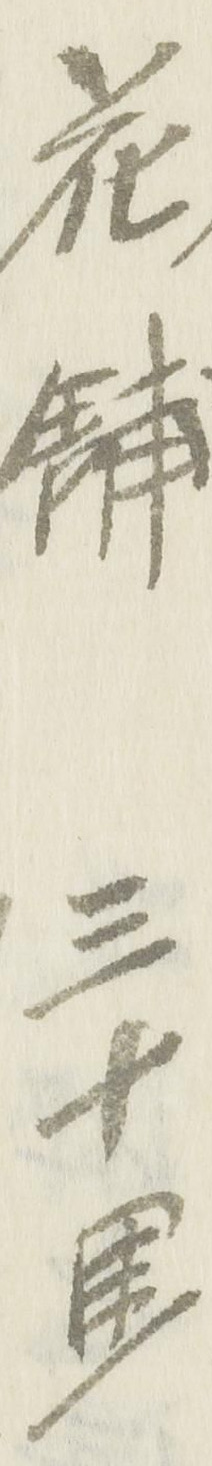花鋪三十里
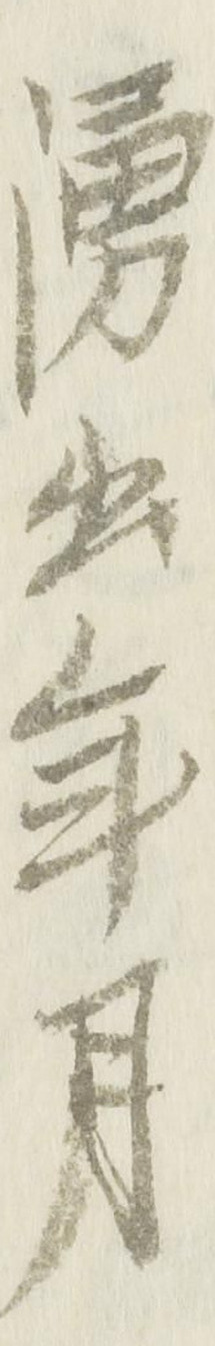湧出年月
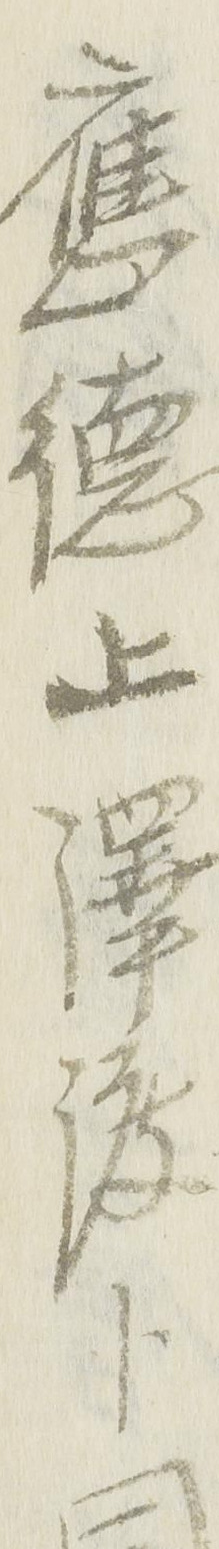応徳上沢渡ト同シ

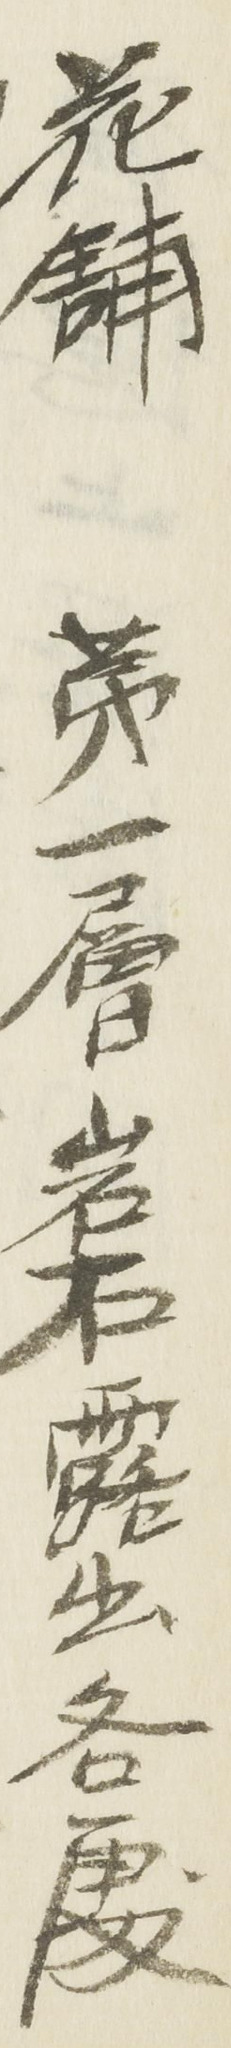花鋪第一層岩石露出各処
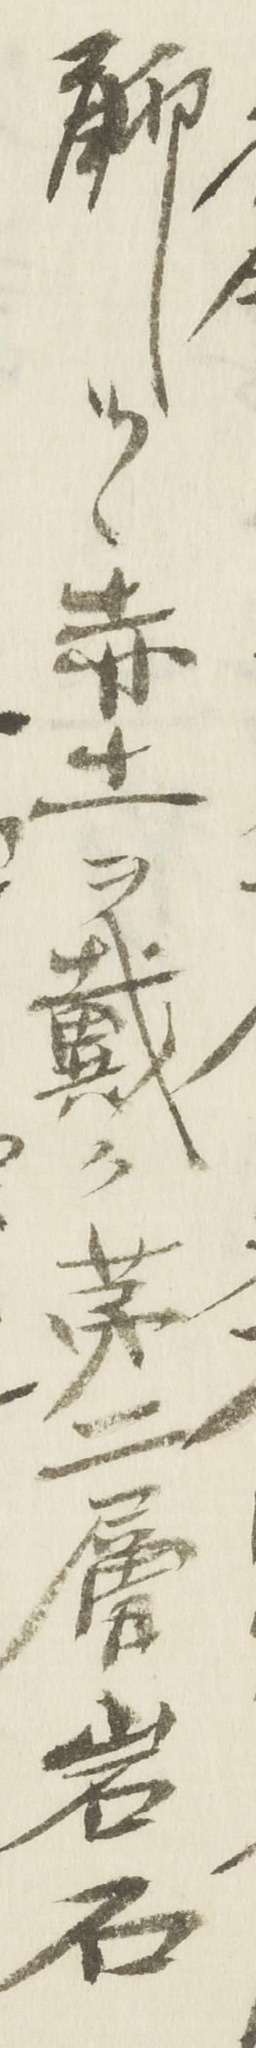聊して赤土ヲ戴ク第二層岩石
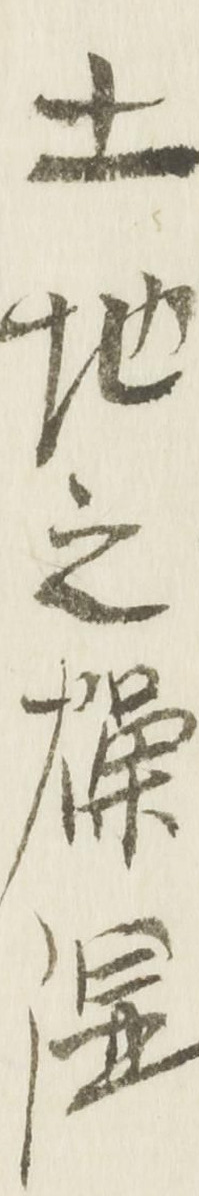土地之燥湿
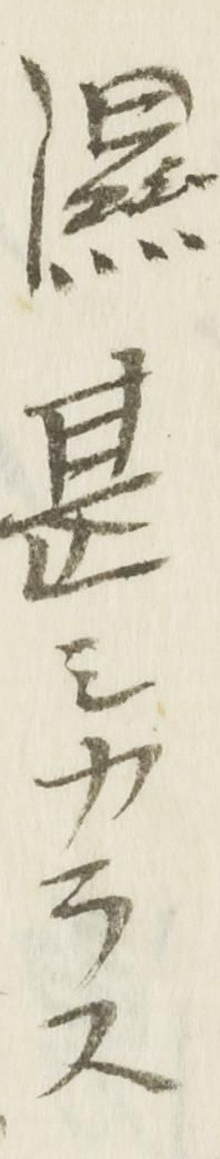湿甚シカラス
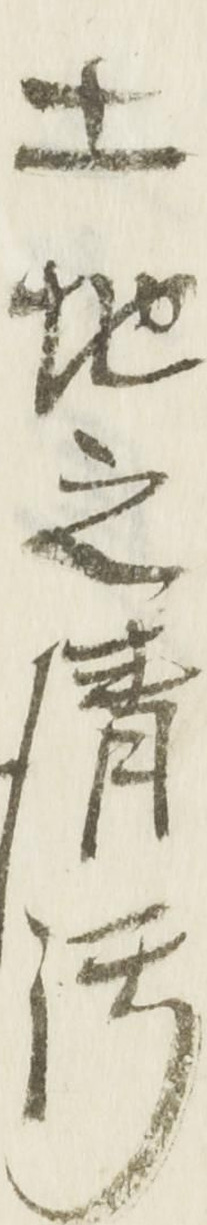土地之清汚
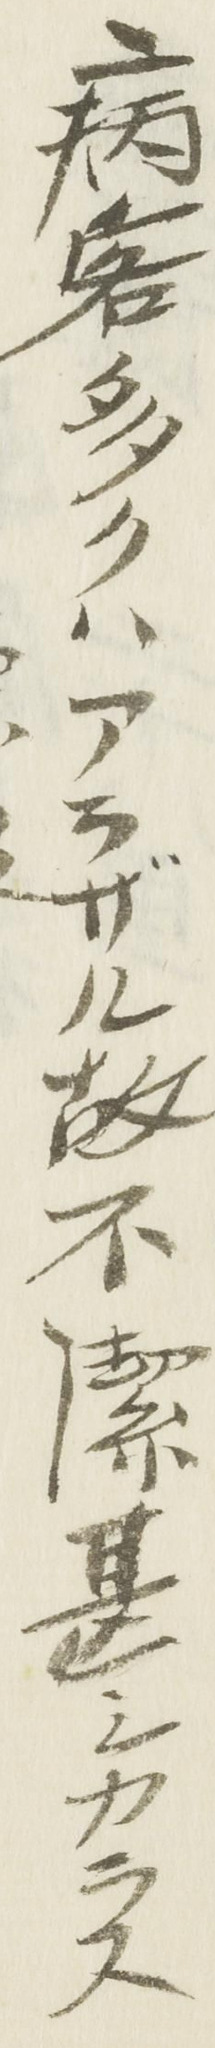病客多クハアラザル故不潔甚シカラス
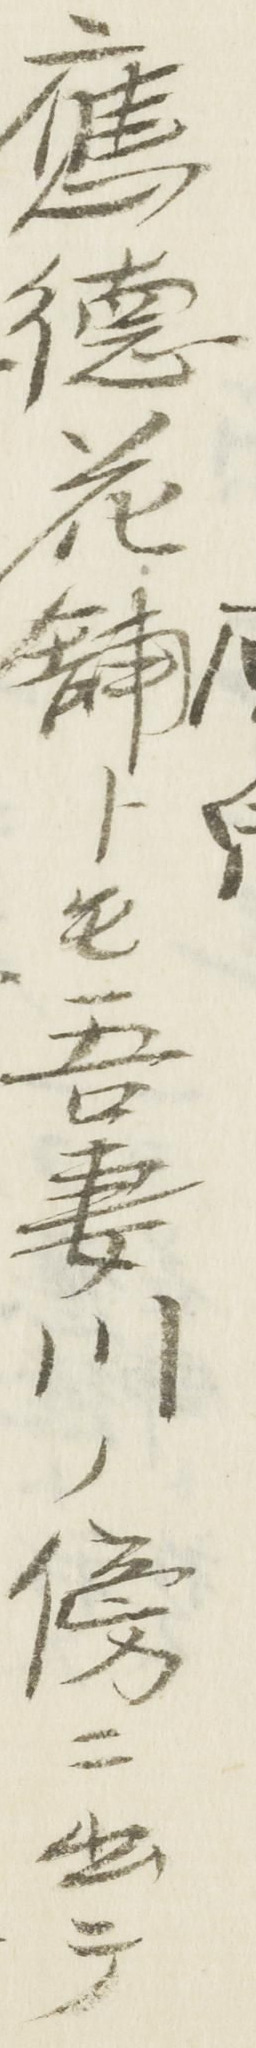応徳花鋪トモ吾妻川ノ傍ニ出て
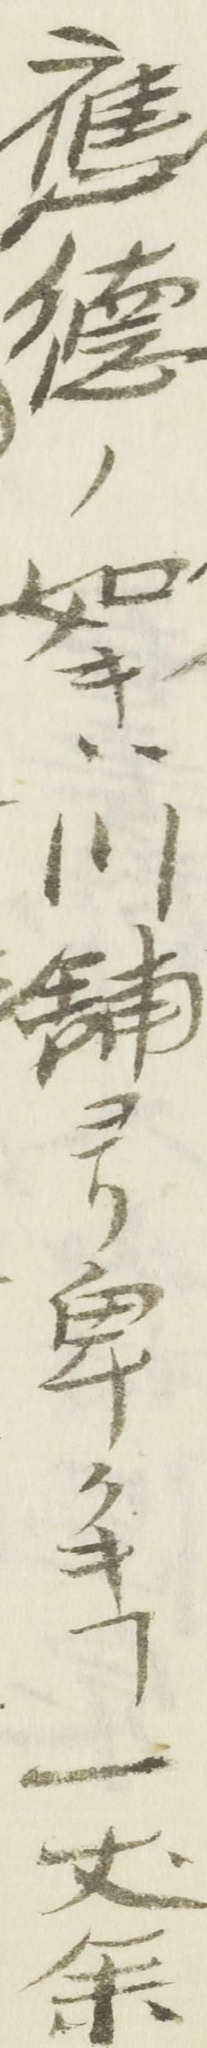応徳ノ如キハ川鋪ヨリ卑クキニ一丈余
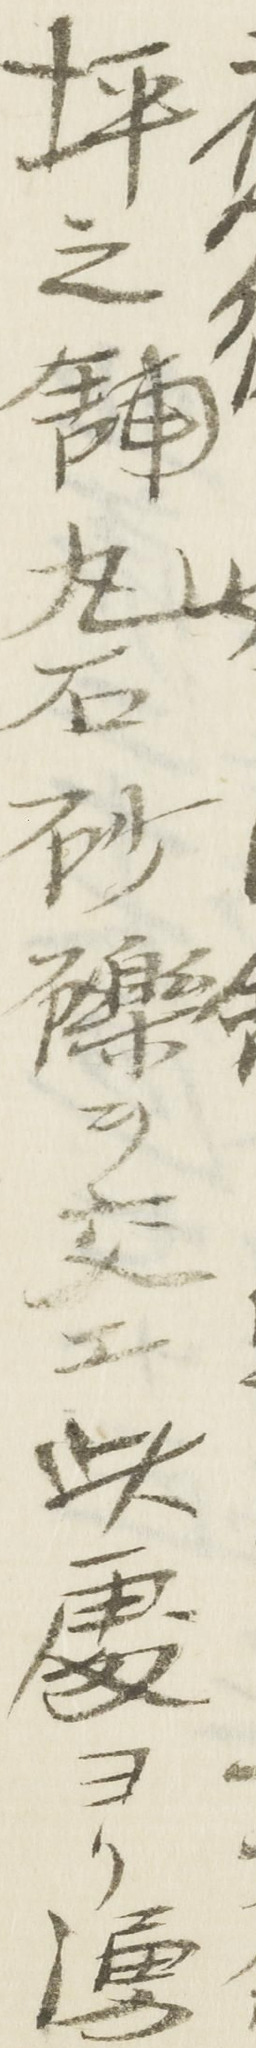坪之庭丸石砂礫ヲ交エ此処ヨリ湧
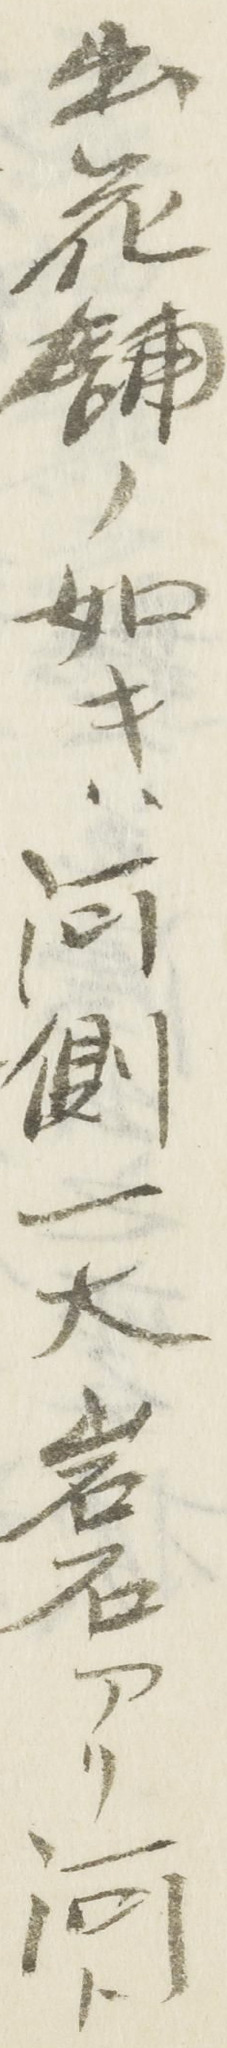出花鋪ノ如キハ河側一大岩石アリ河ト
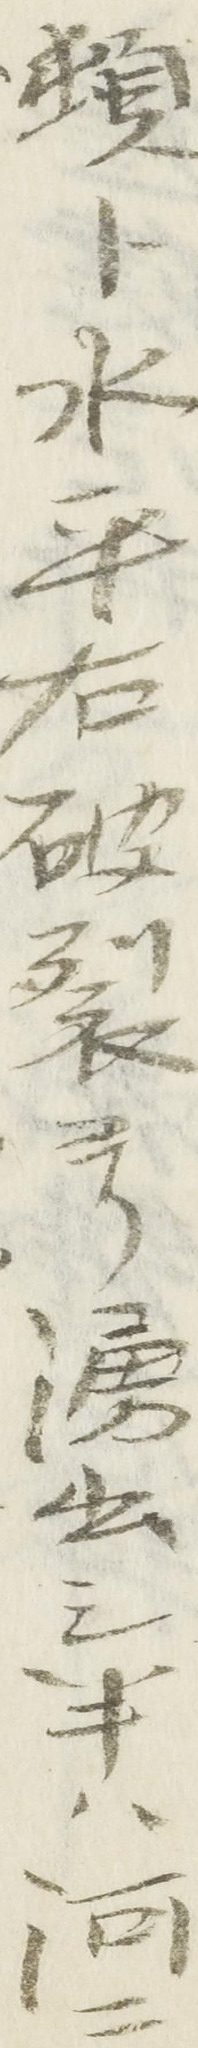頓ト水平右破裂湧出シ半ハ河ニ
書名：温冷泉試験表
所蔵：東京大学地震研究所図書室 Earthquake Research Institute Library, The University of Tokyo, JAPAN
